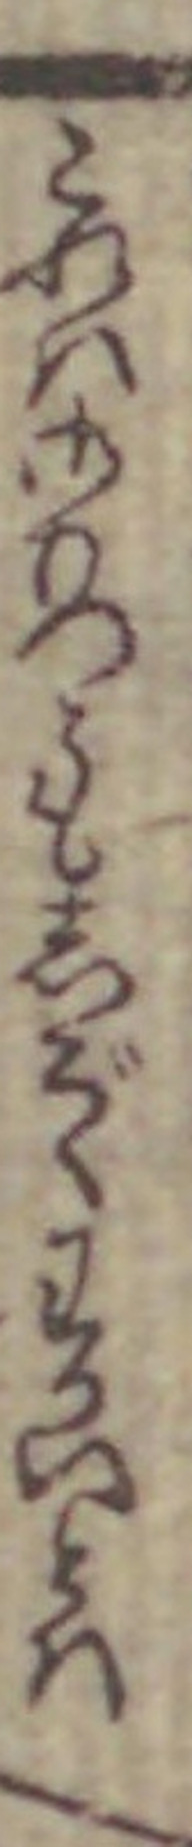これは御もつともしごくわかいとは
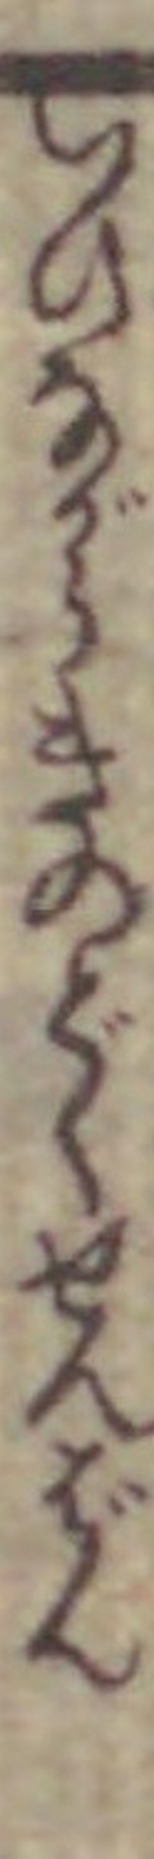いひながらきのどくせんばん
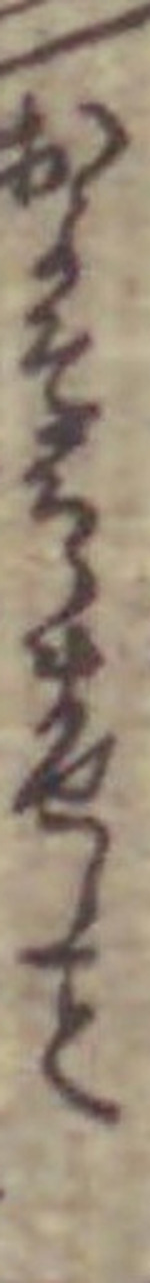およそはらませしこと
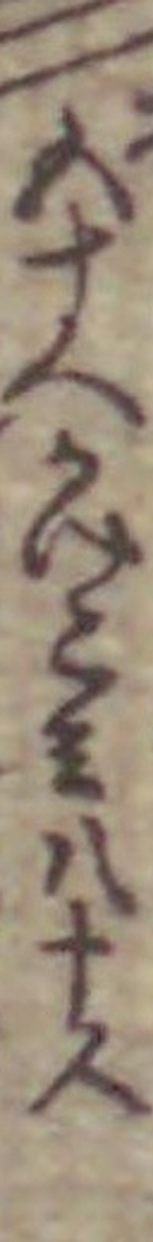五十人かけこみ八十人
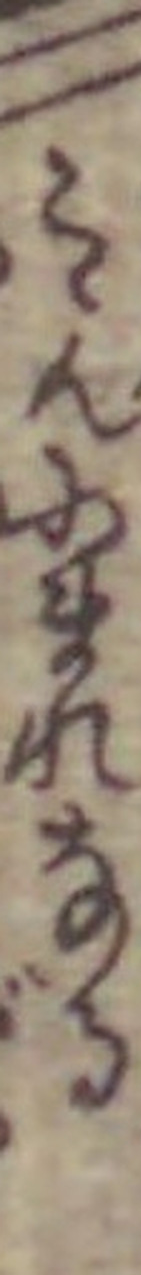こゝんにまれなる
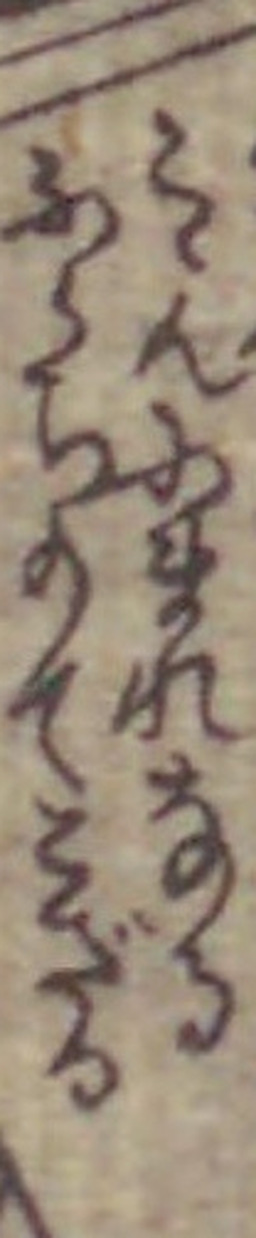ふらちものてござる
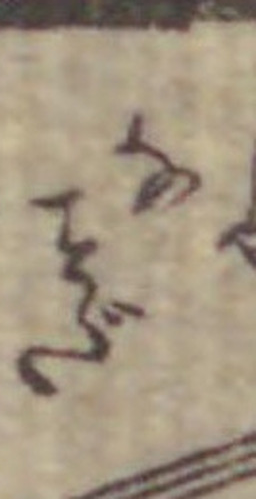ことだ
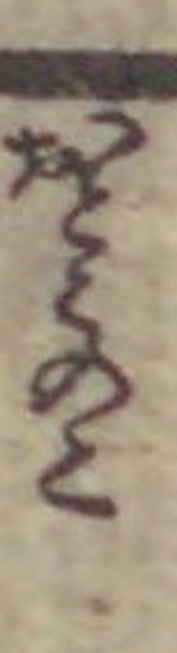おとこのこ
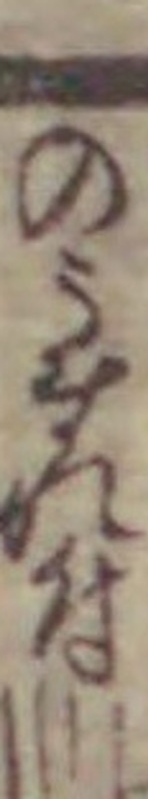のうまれ付
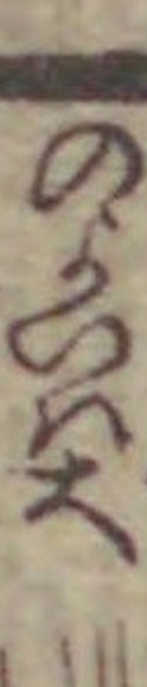のよいは大
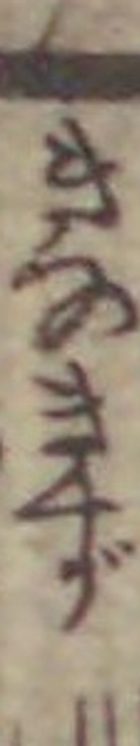きなきず
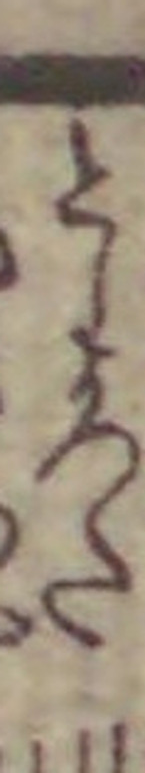としよつた
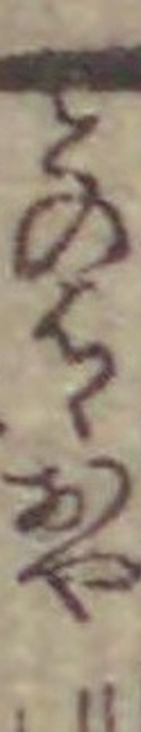このはゝおや
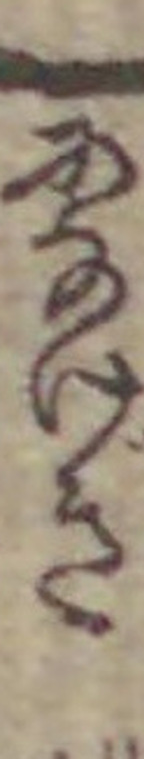になげき
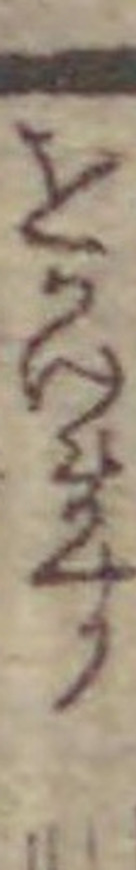をかけます
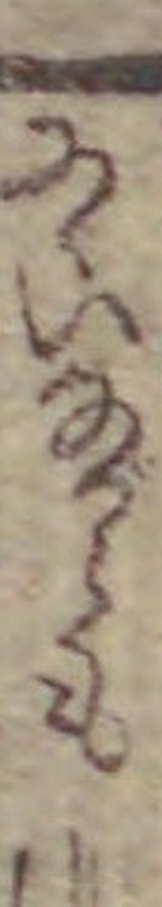にくいながらも
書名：止而道致虚録 3巻
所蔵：国立国会図書館 National Diet Library, JAPAN
